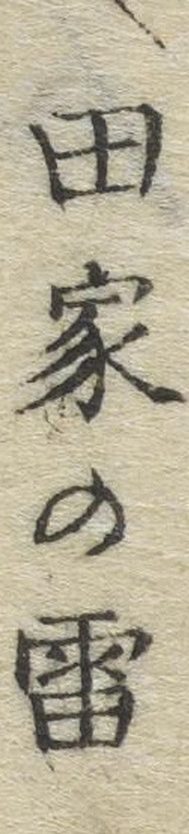田家の雷
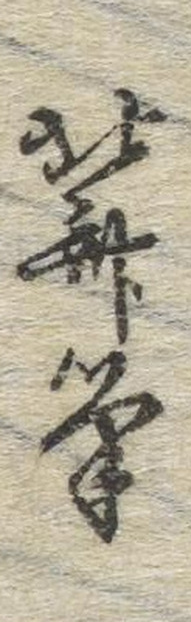北斎筆

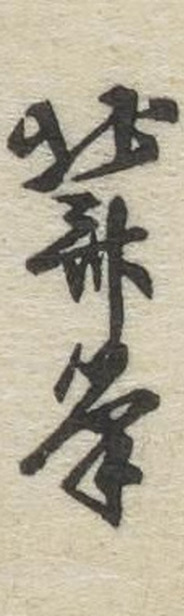北斎筆

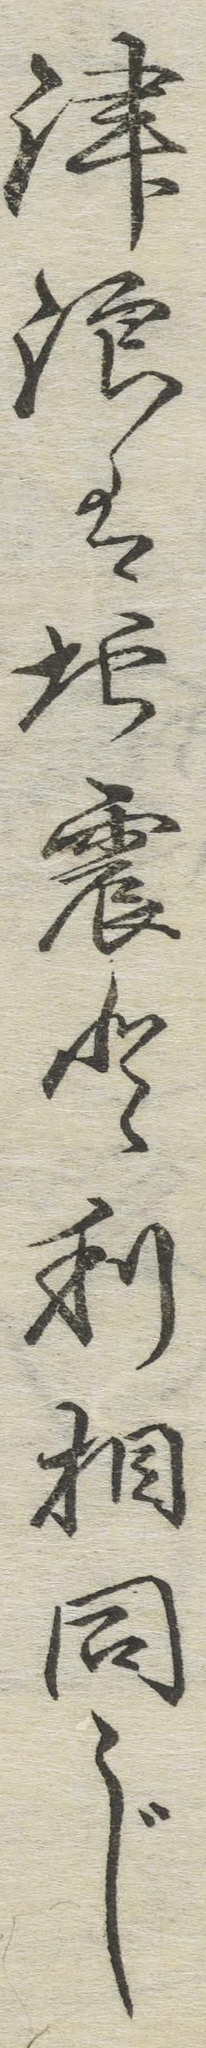津浪は地震と利相同じ
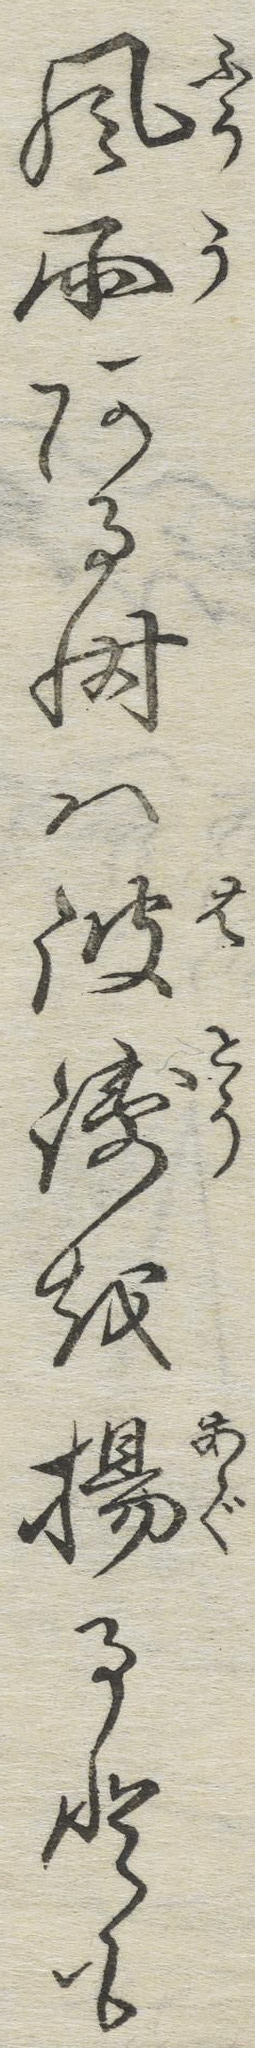風雨ある時は波涛を揚るとも
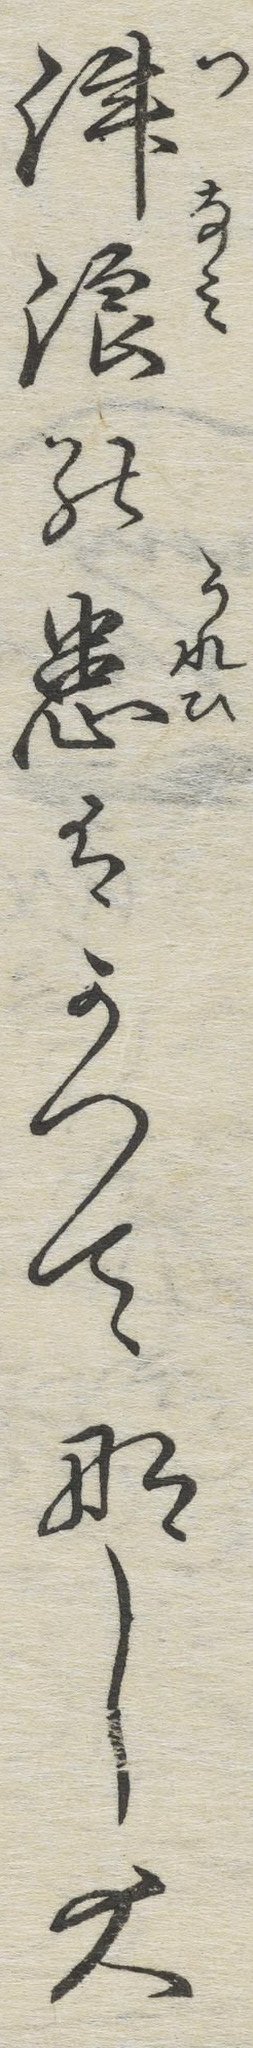津浪の患はかつてなし大
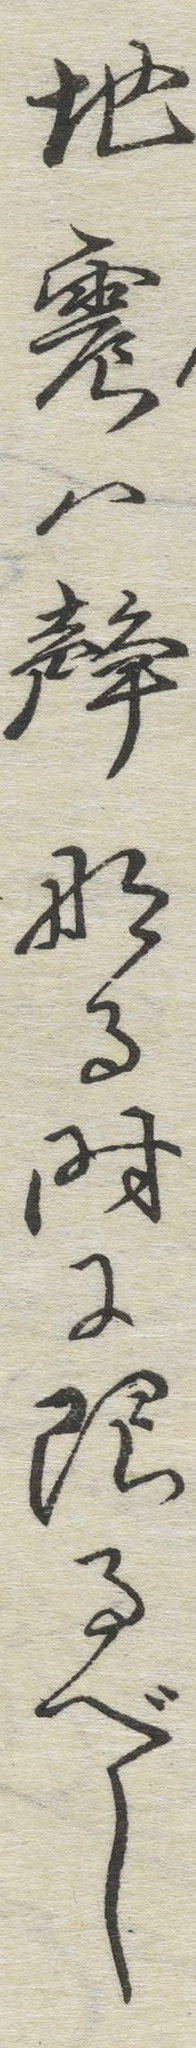地震は静なる時に限るべし

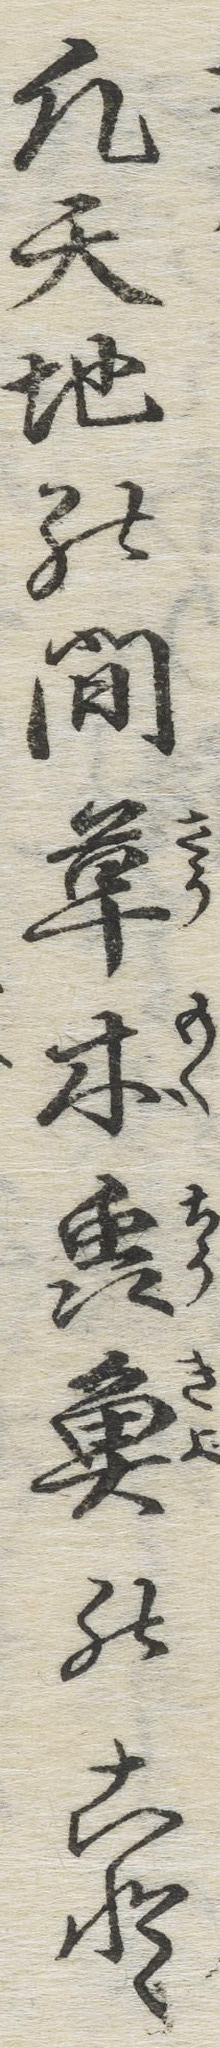凢天地の間草木虫魚のこと
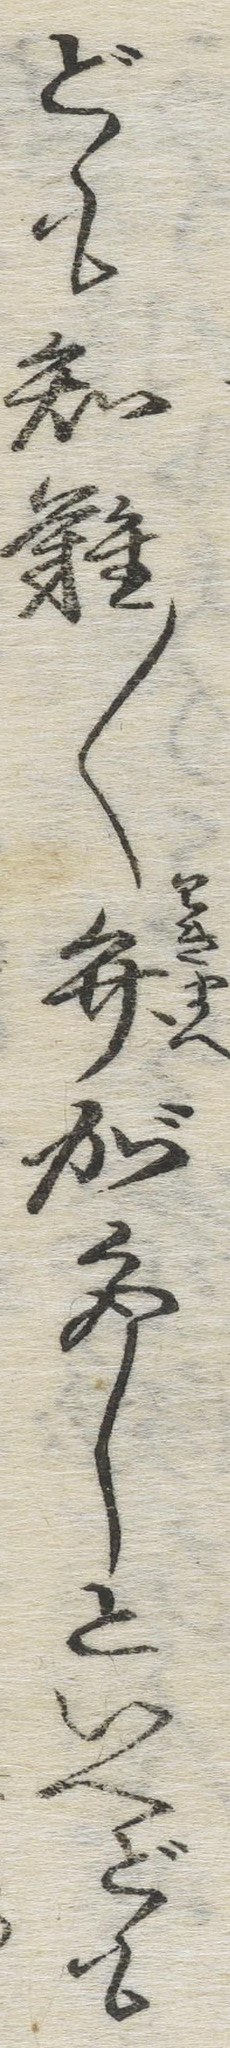ども知難く弁がたしといへども
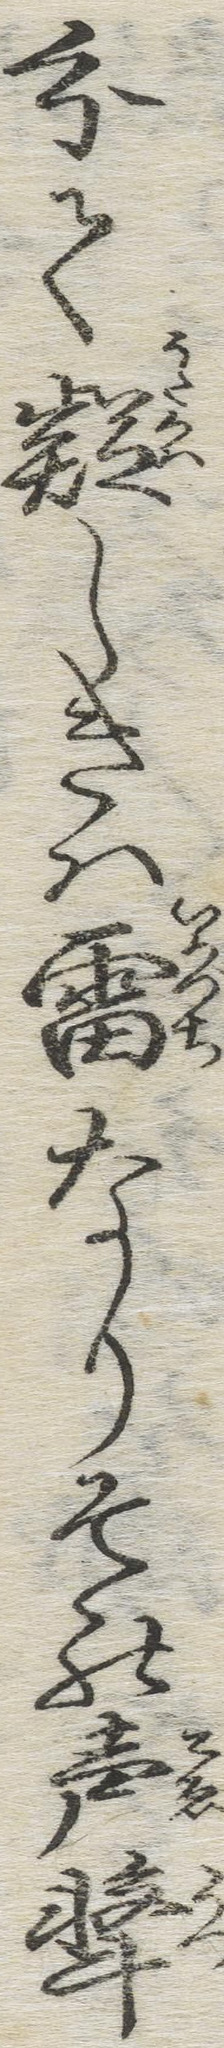分て疑しきは雷なりその声撃
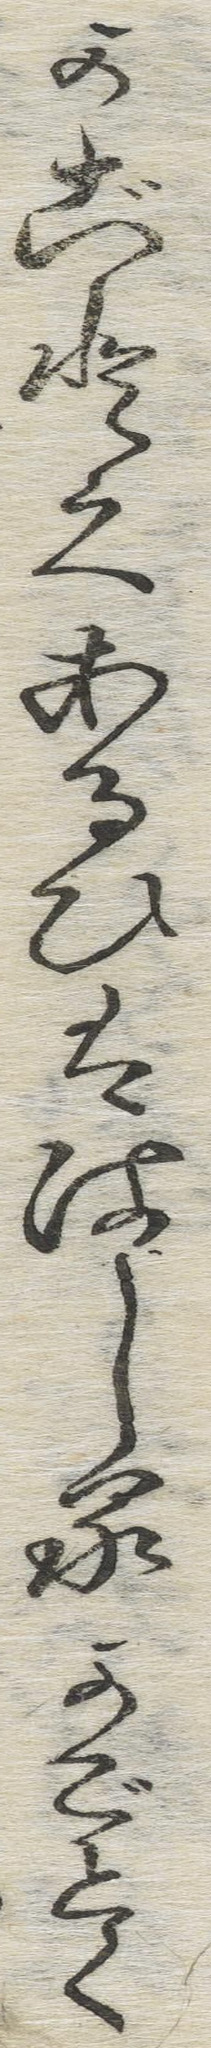かごとくあるひははしるかごとく
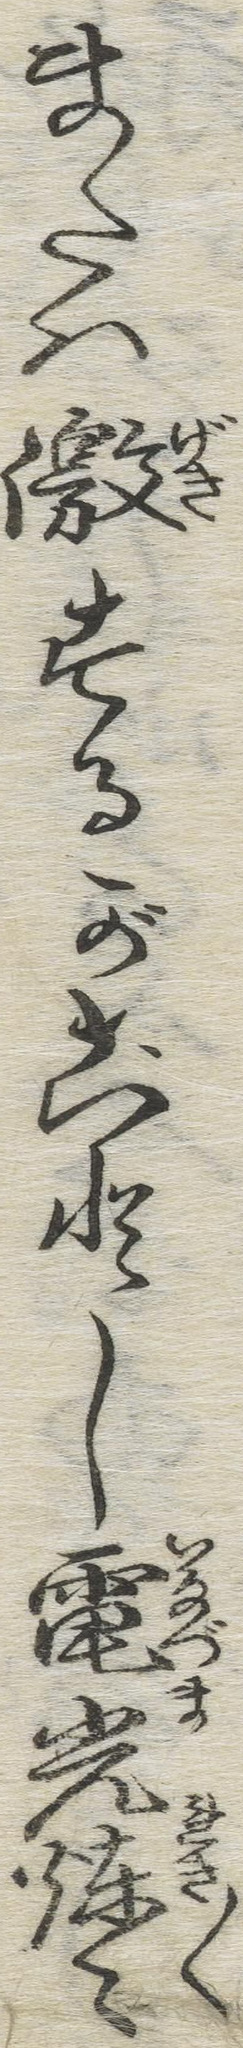または激するがごとし電光煉々
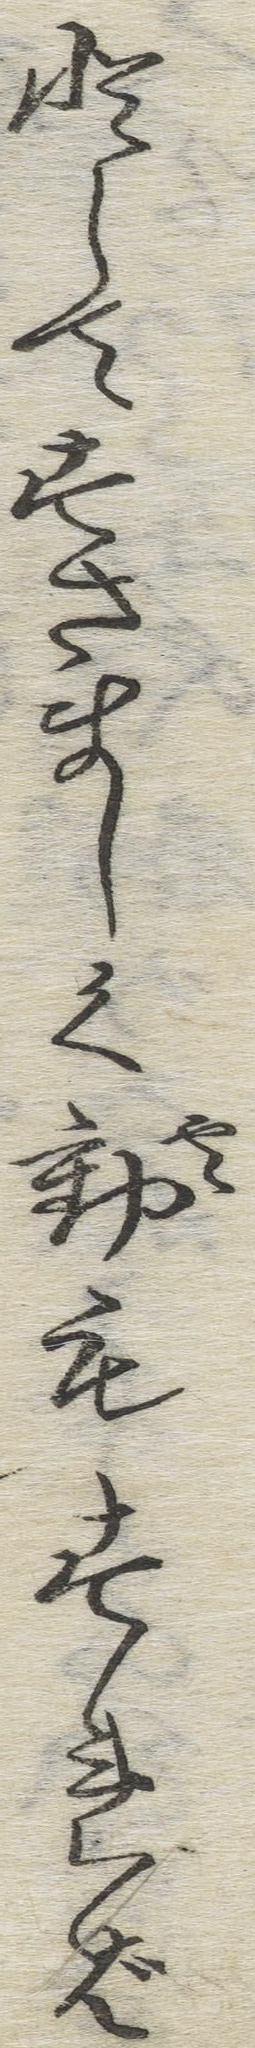としてすさましく動もすれば
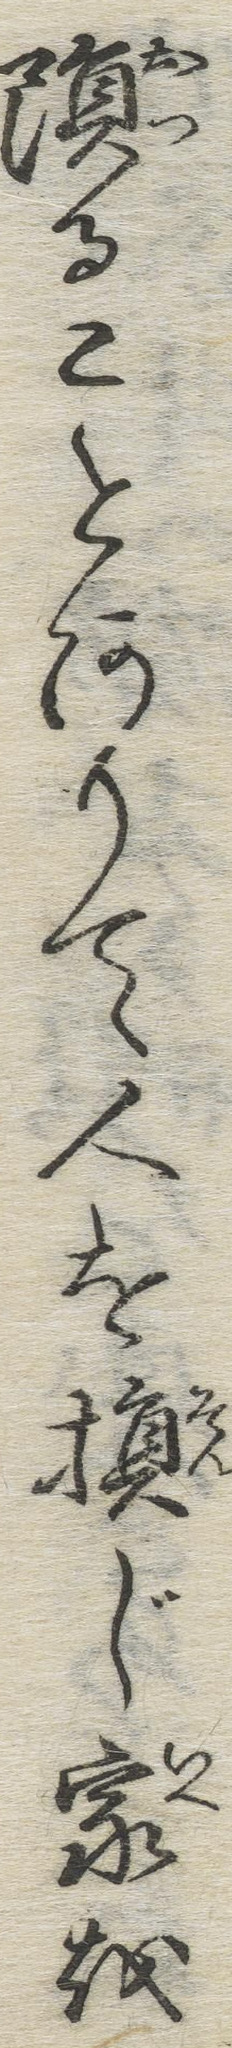隕ることありて人を損じ家を

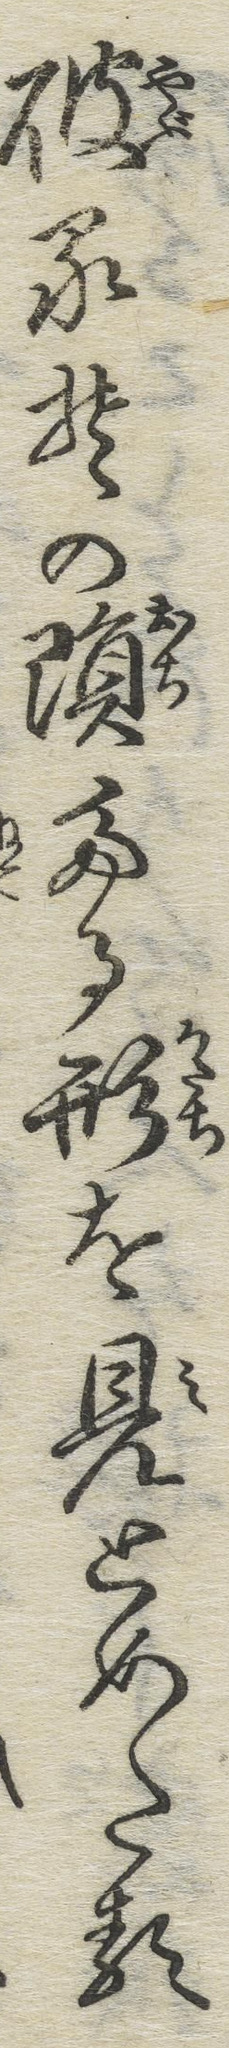破るその隕たる形を見とめたる
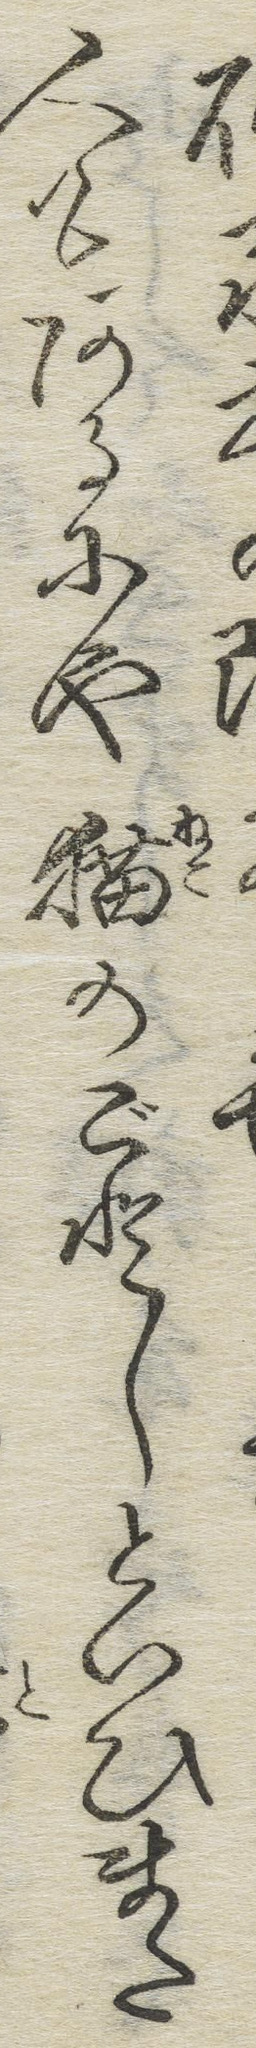人もあるにや猫のごとしといひまた
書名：雷公地震由來記　全
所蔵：東京大学地震研究所図書室 Earthquake Research Institute Library, The University of Tokyo, JAPAN
